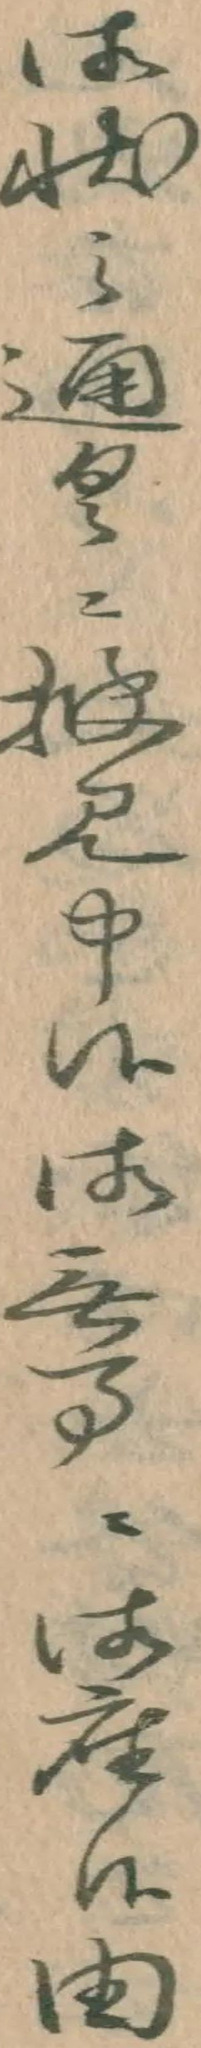御状之通具に披見申候御無事に御座候由
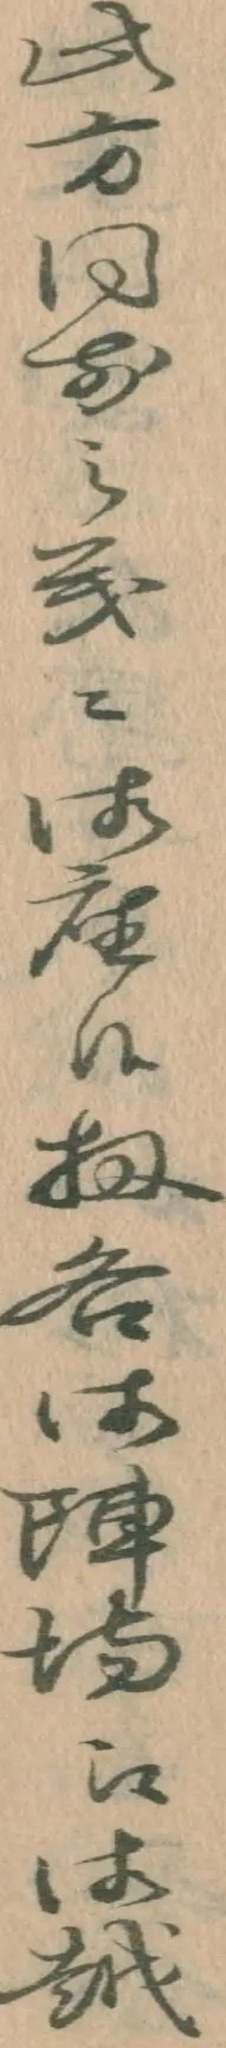此方同前之義に御座候扨各御陣場江御越
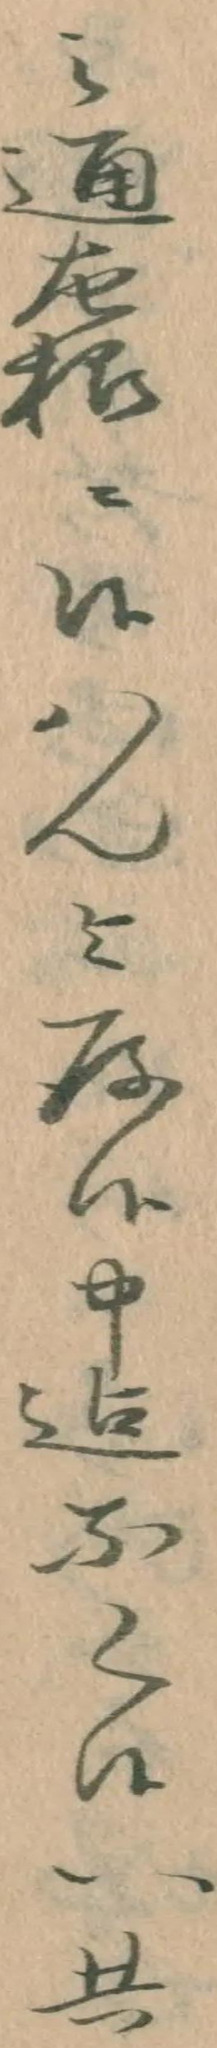之通左様に候はん与存候申迄なく候へ共
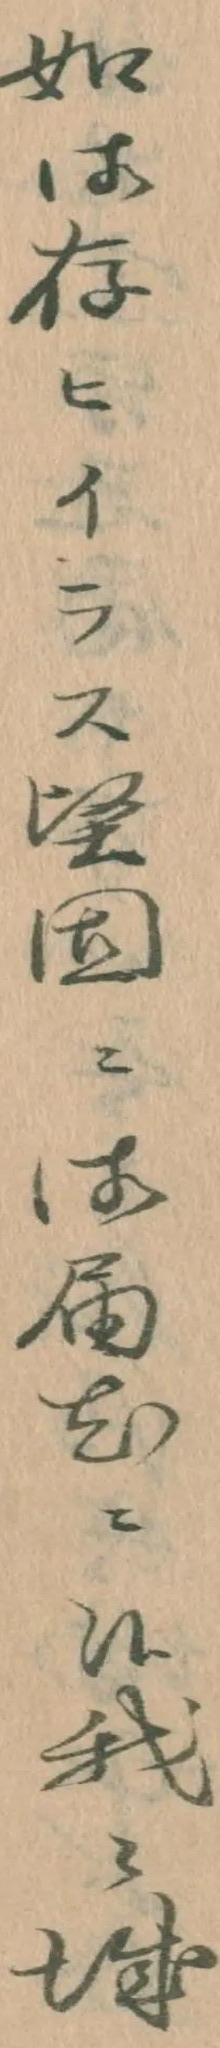如御存ひいらす堅固に御届尤に候我々城
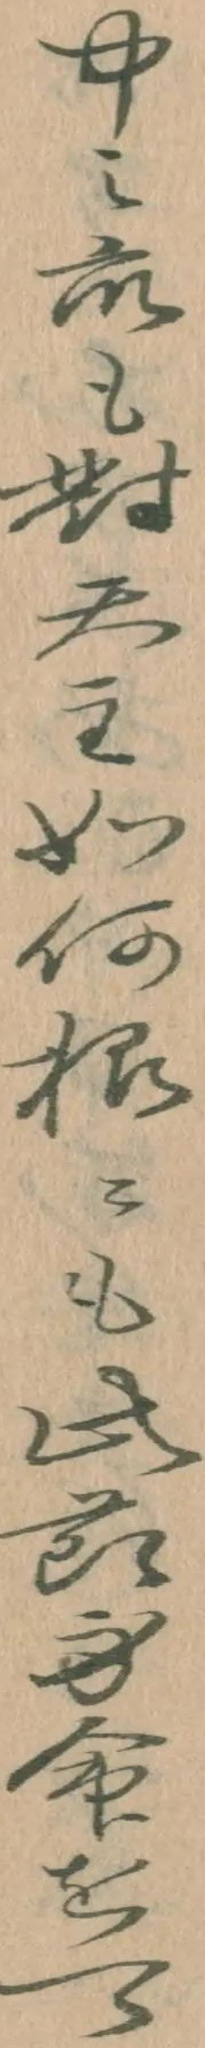中之衆も対天主如何様にも此節身命を可
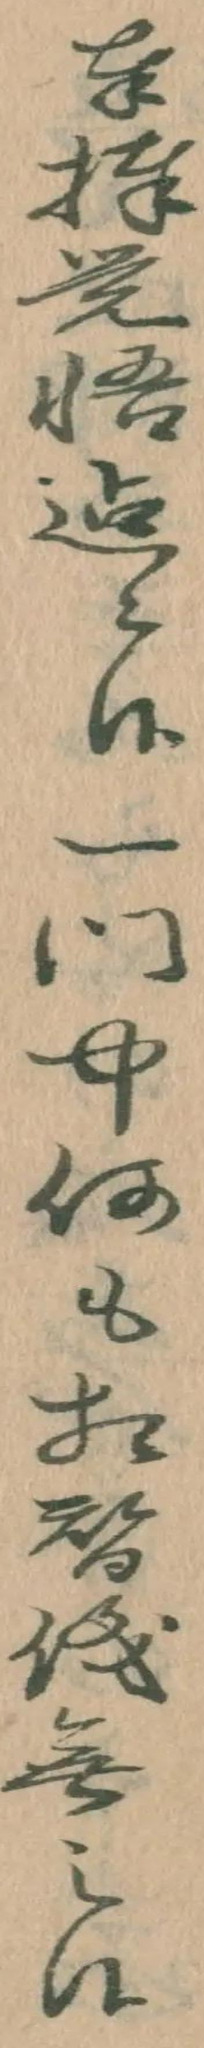奉捧覚悟迄に候一門中何も相替儀無之候
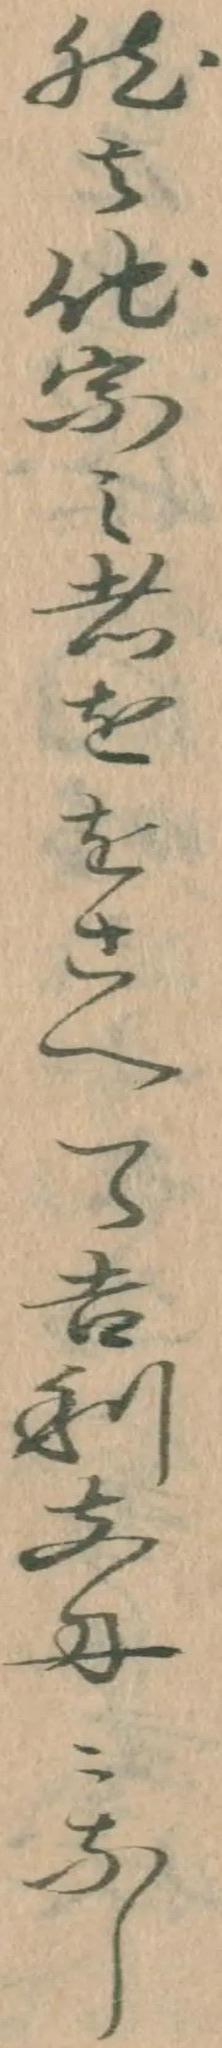然者他宗之者ををさへて吉利支丹になし
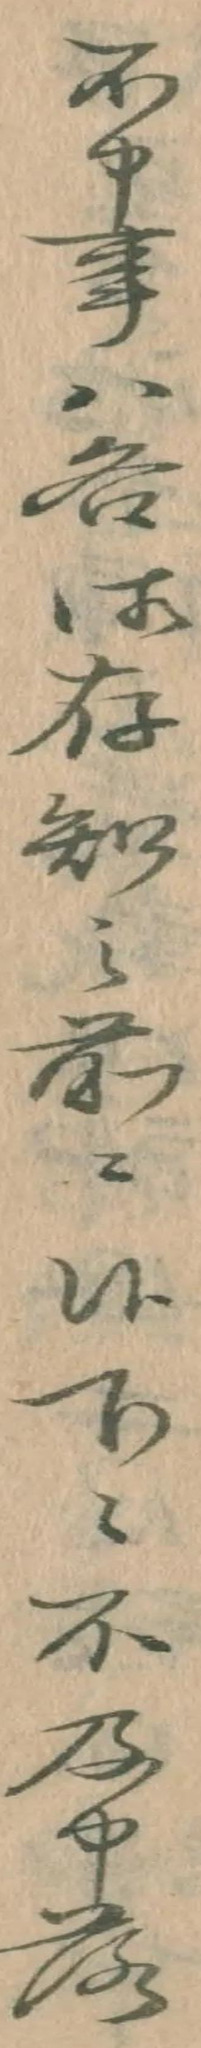不申事は各御存知之前に候下々不及申落
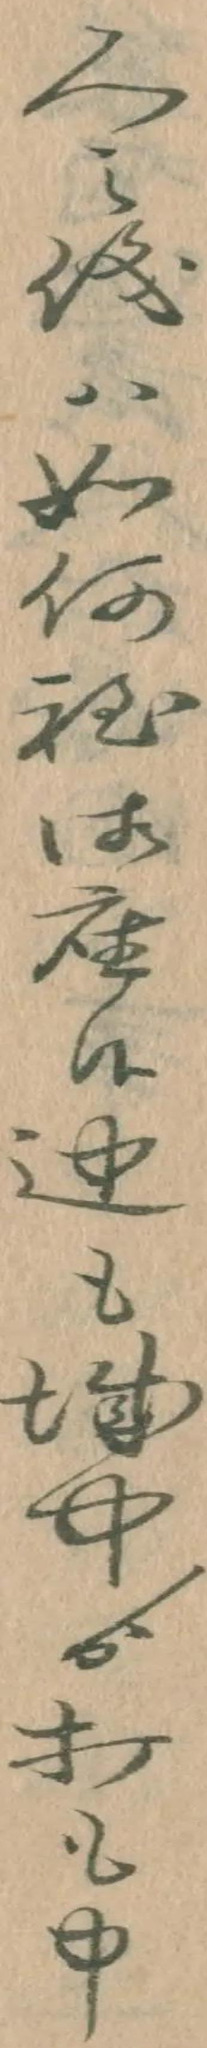人之儀は如何程御座候迚も城中ゟ打も申
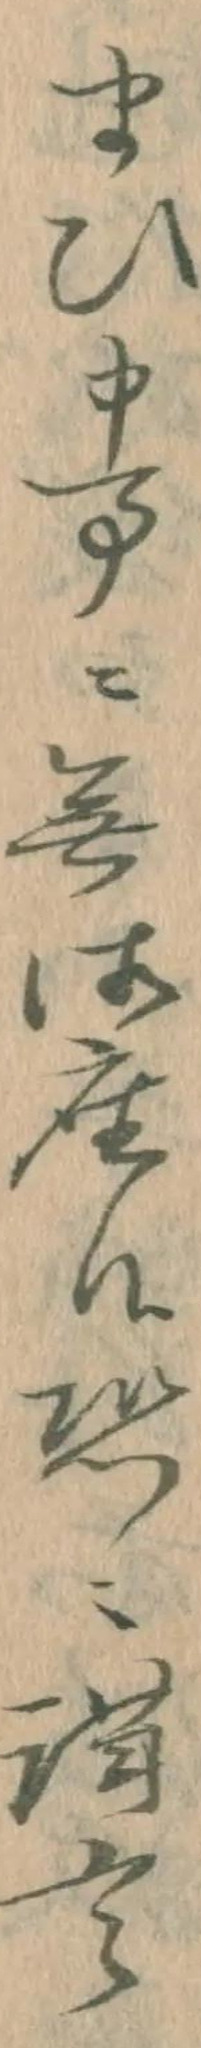まひ申事に無御座候恐々謹言
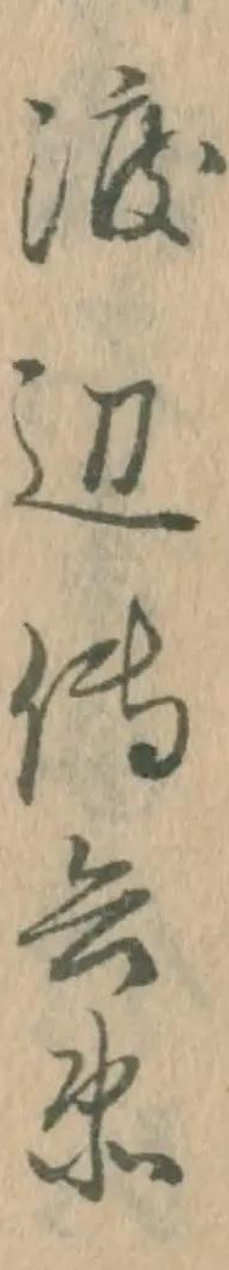渡辺伝兵衛
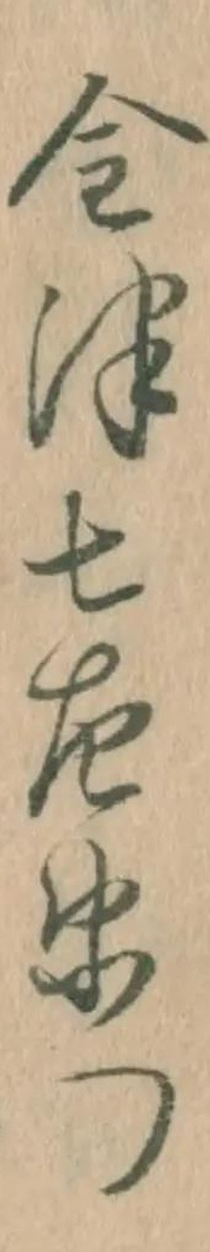合津七左衛門
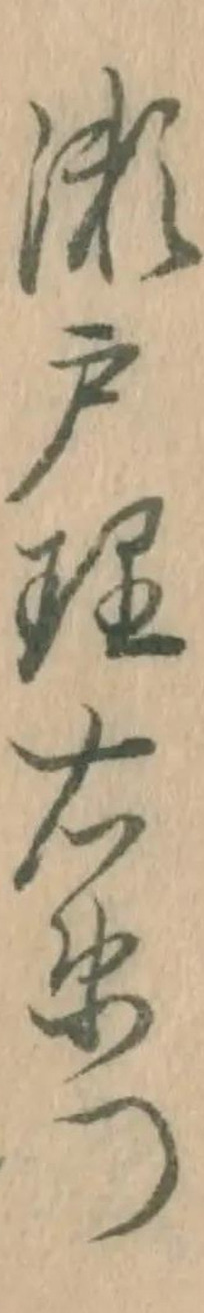瀬戸理右衛門
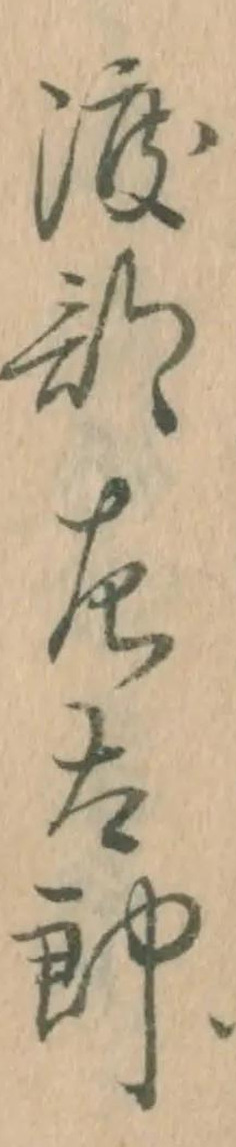渡部左太郎

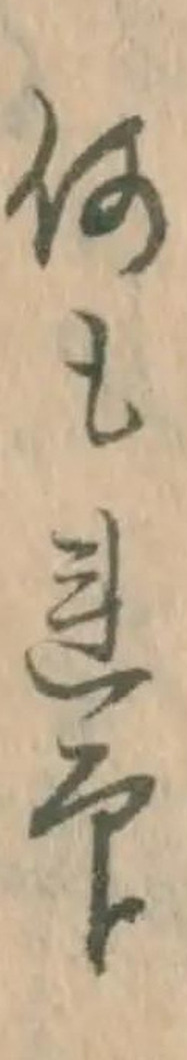何も連印
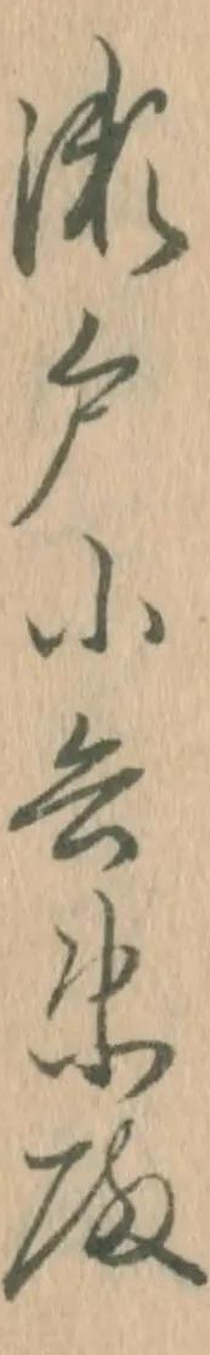瀬戸小兵衛殿
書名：切支丹御退治記 49巻. [6]
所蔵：国立国会図書館 National Diet Library, JAPAN
